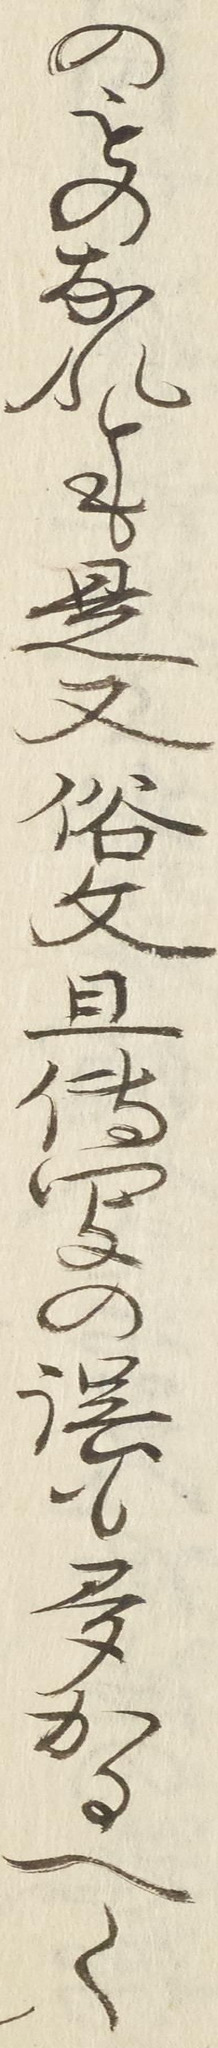のものなれとも是又俗文且伝写の誤も多かるへく
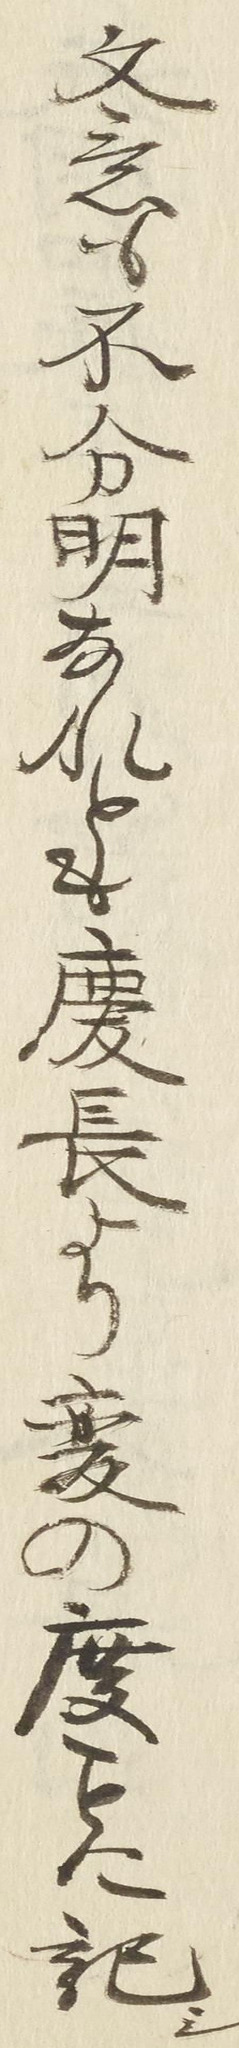文意も不分明なれとも慶長より変の度ことに記し
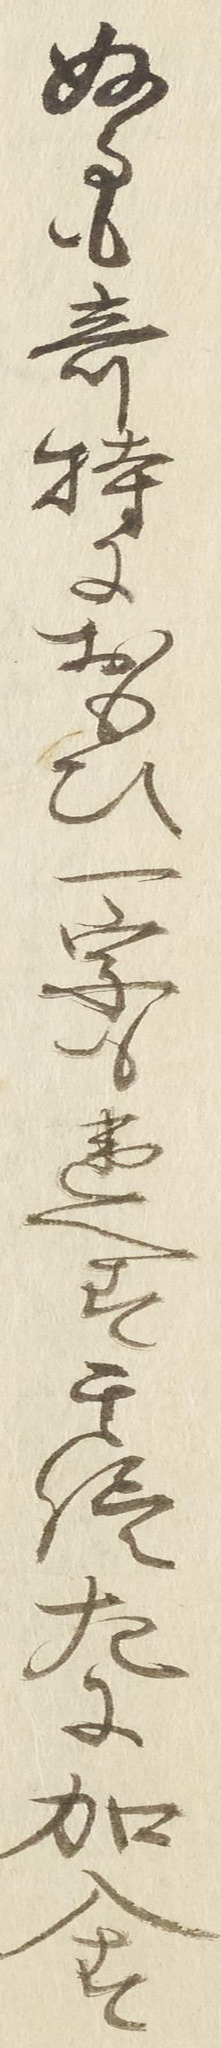ぬるも奇特におもひ一字も違えす其侭左に加入す
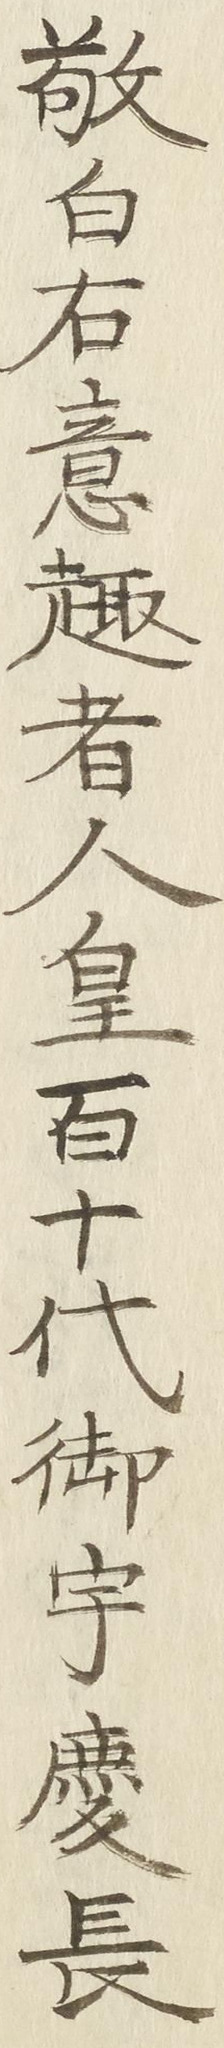敬白右意趣者人皇百十代御宇慶長
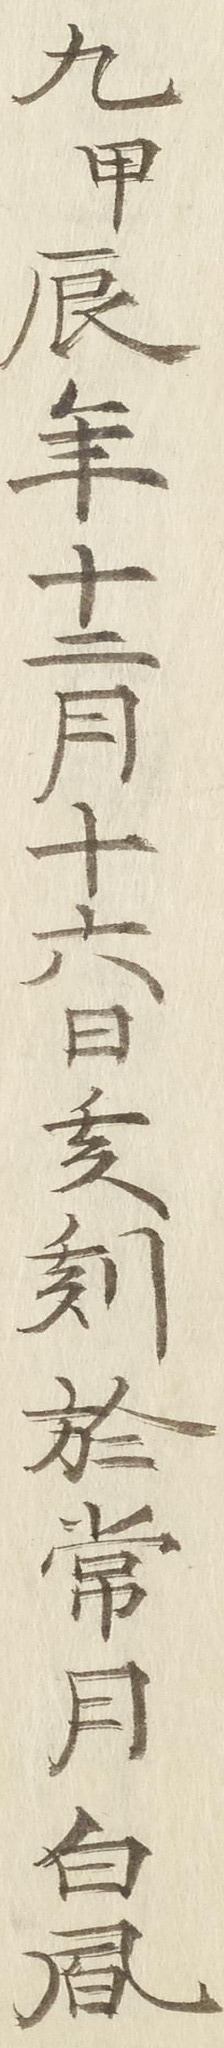九甲辰年十二月十六日亥刻於常月白凮
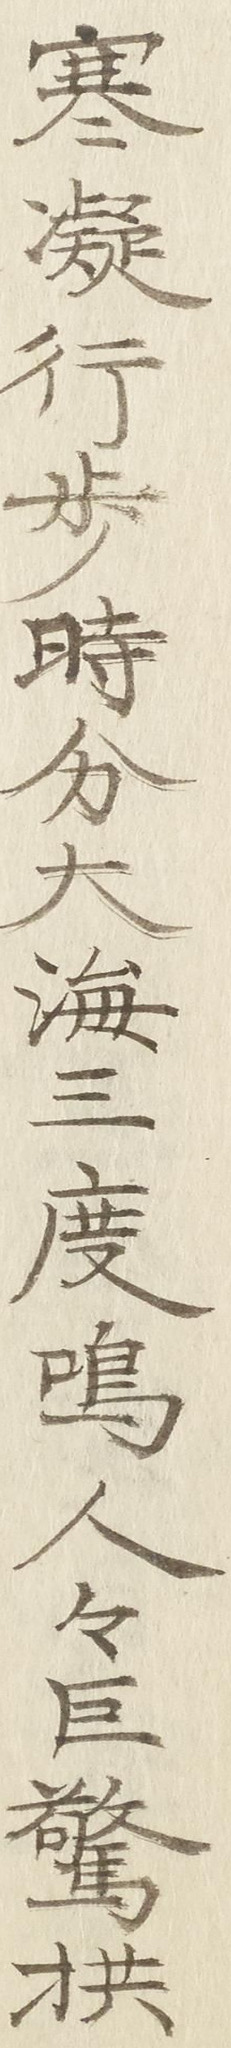寒凝行歩時分大海三度鳴人々巨驚拱
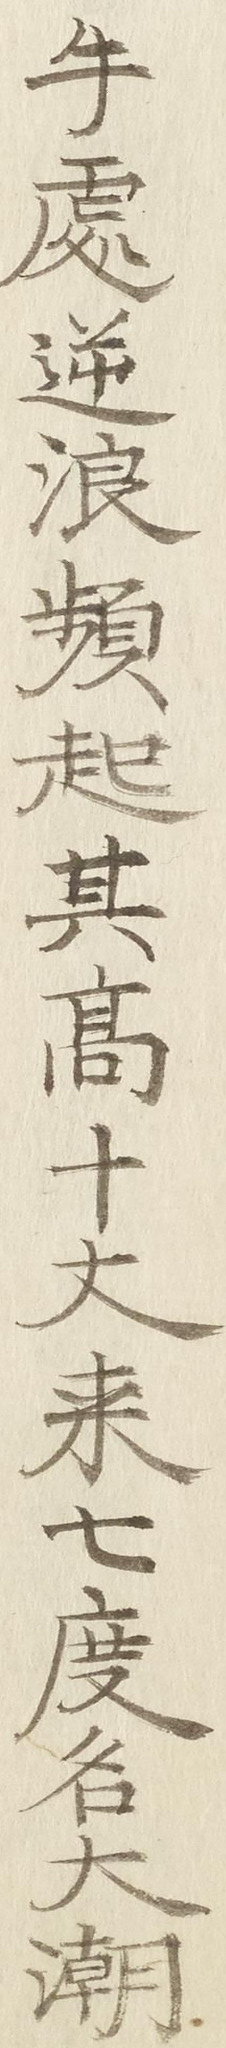手処逆浪頻起其高十丈来七度名大潮
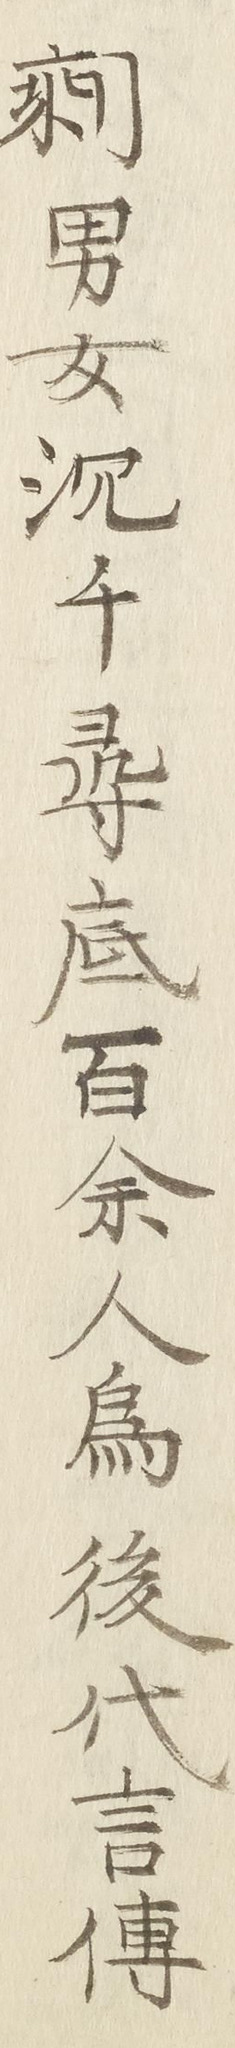剰男女沈千尋底百余人為後代言伝
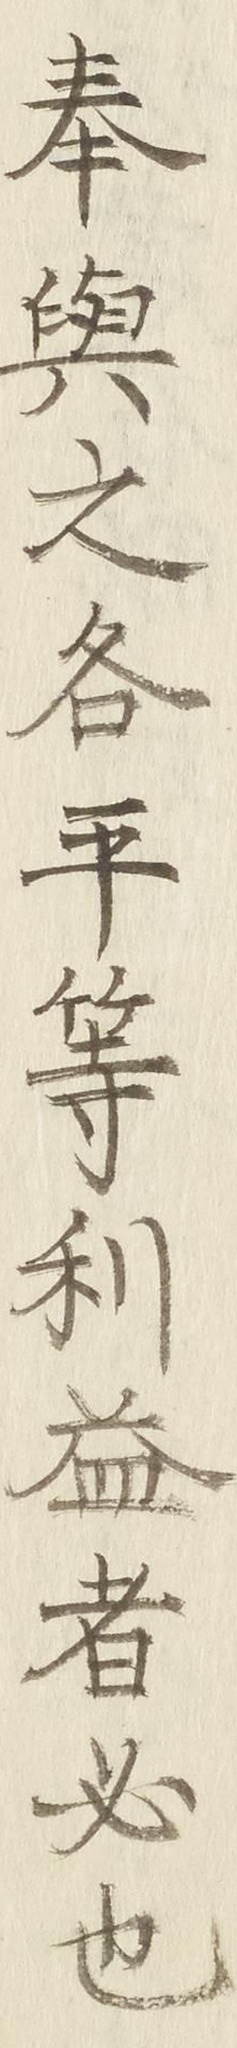奉与之各平等利益者必也
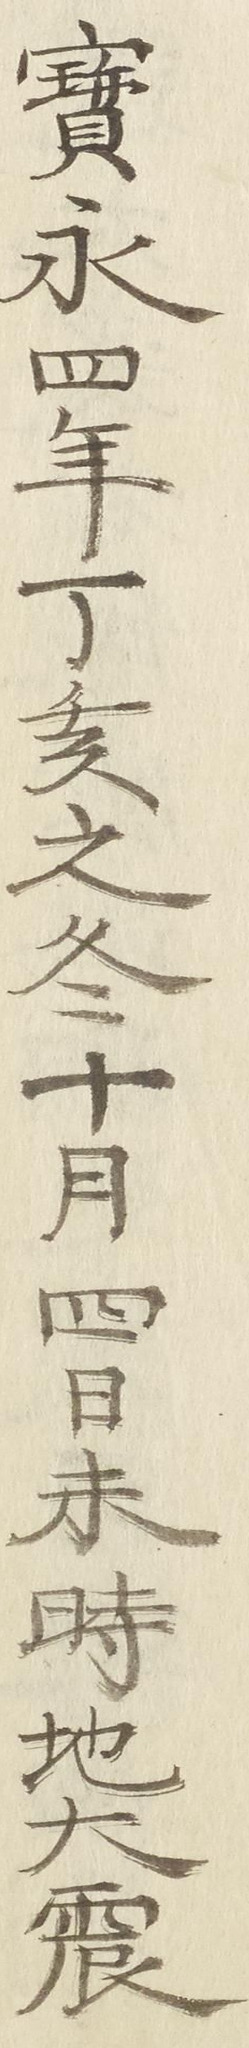宝永四年丁亥之冬十月四日未時地大震
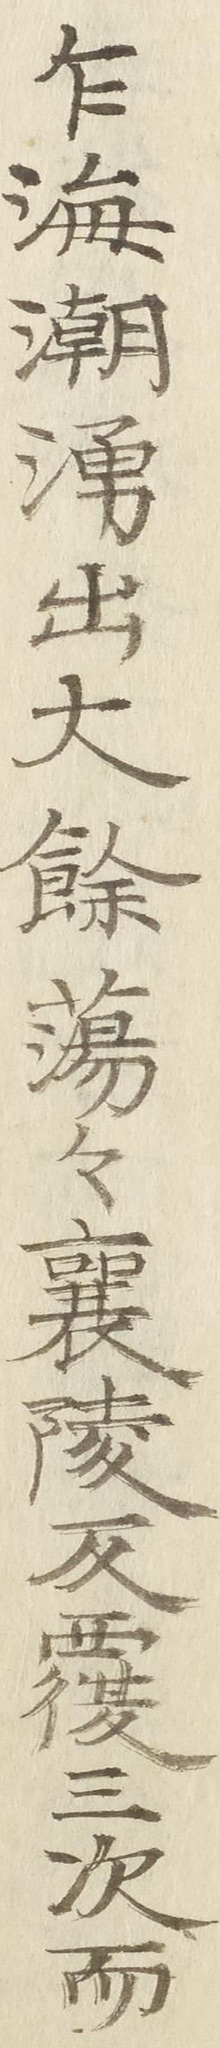乍海潮湧出大余蕩々襄陵反覆三次而

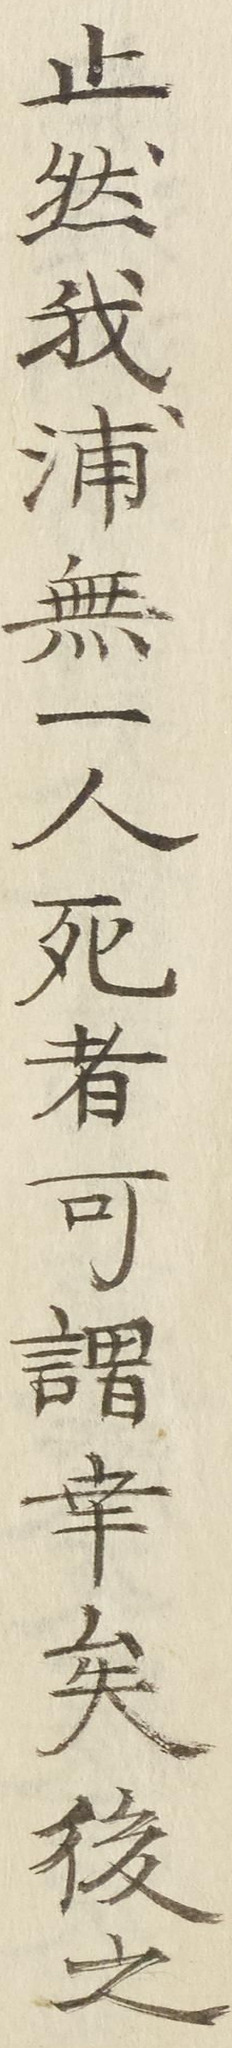止然我浦無一人死者可謂幸矣後之
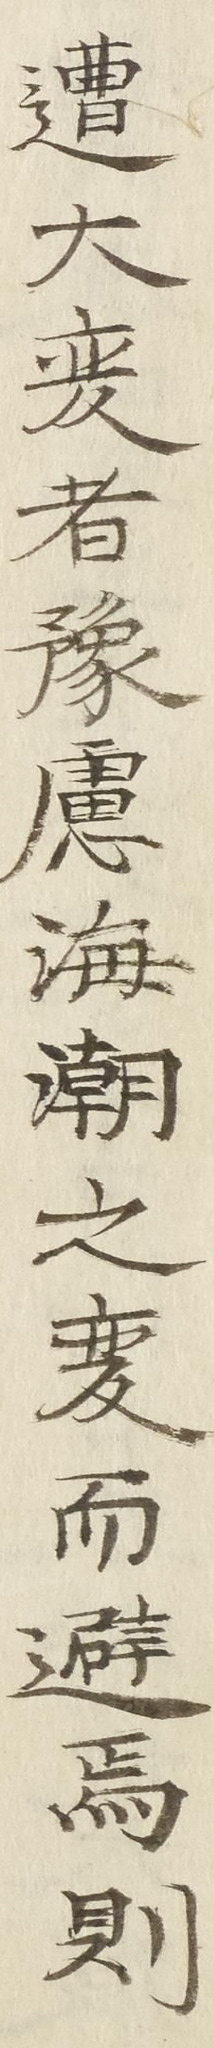遭大変者豫慮海潮之変而避焉則
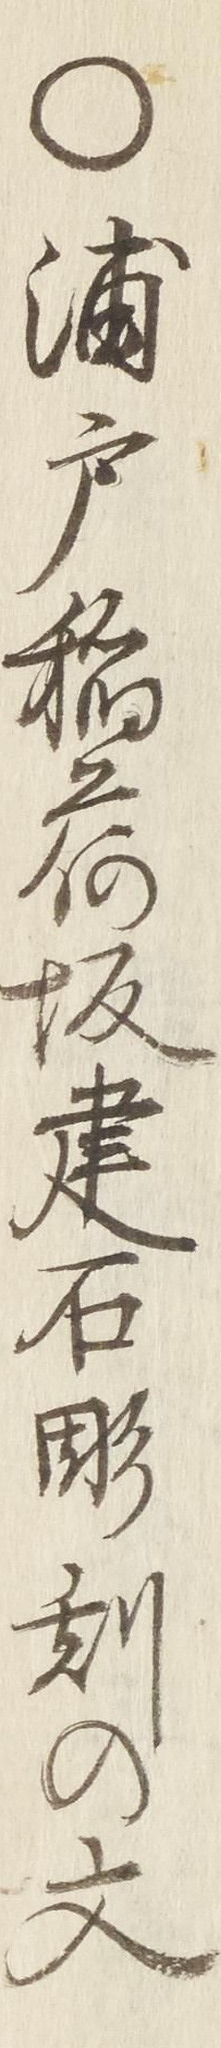〇浦戸稲荷坂建石彫刻の文
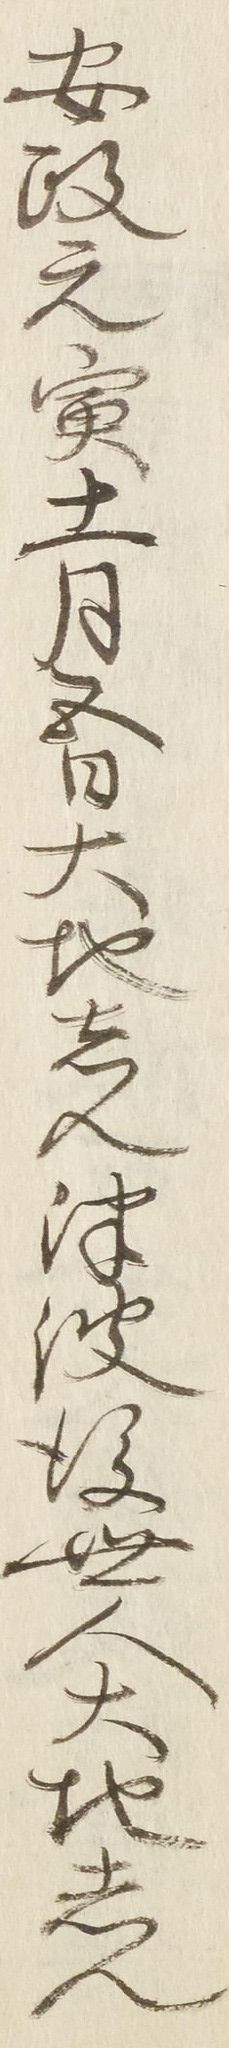安政元寅十一月五日大地しん津波後世人大地しん
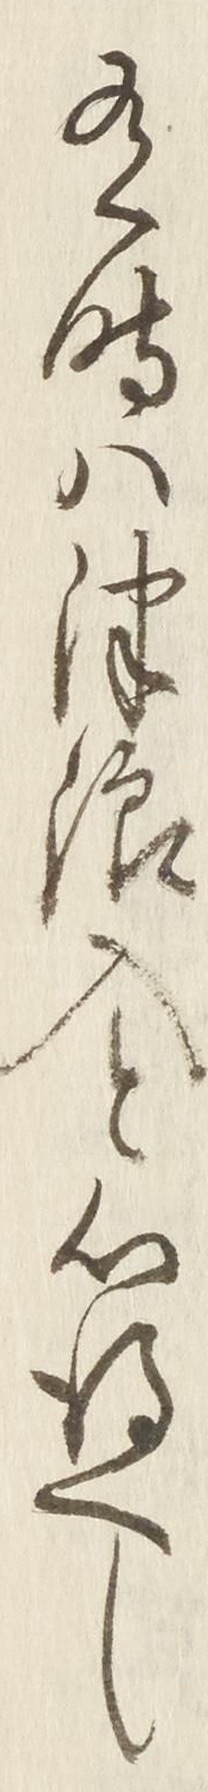有時は津浪入と心得へし
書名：地震記　上
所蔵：東京大学地震研究所図書室 Earthquake Research Institute Library, The University of Tokyo, JAPAN
